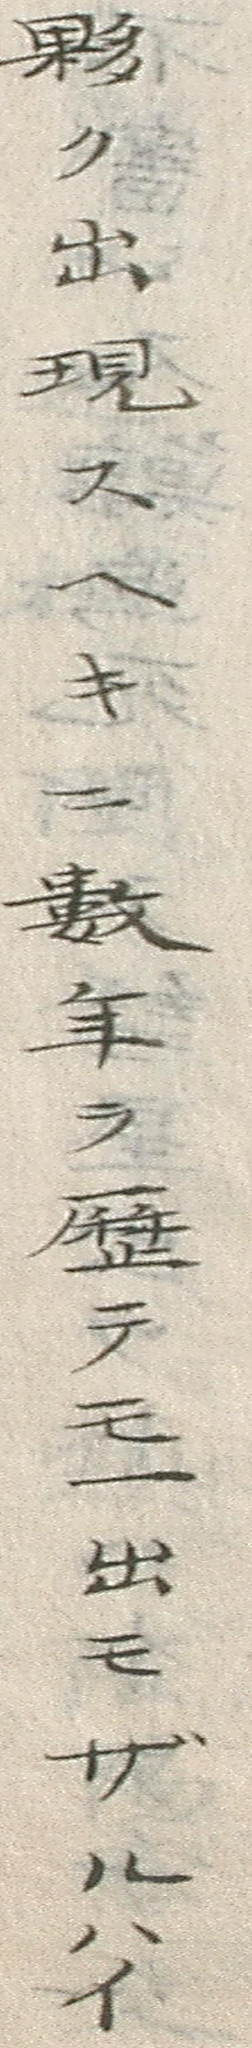夥ク出現スヘキニ数年ヲ歴テモ一出モザルハイ
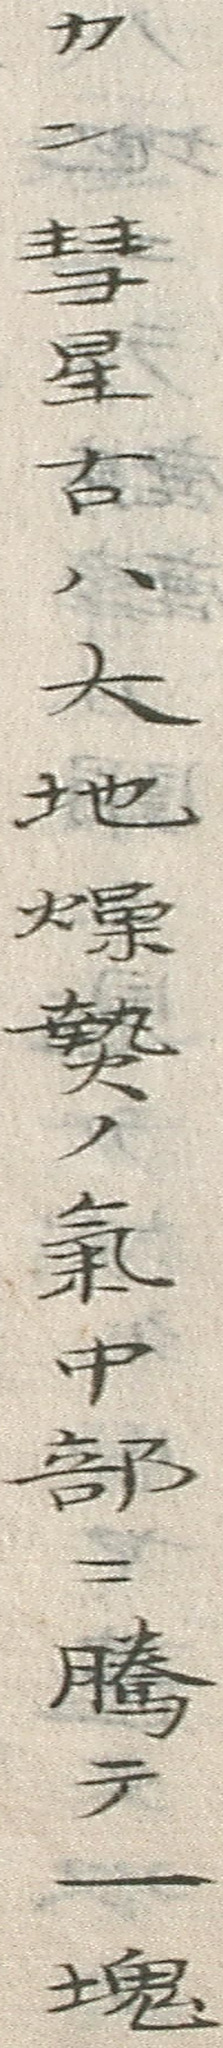カン彗星古ハ大地燥熱ノ気中部ニ騰テ一塊
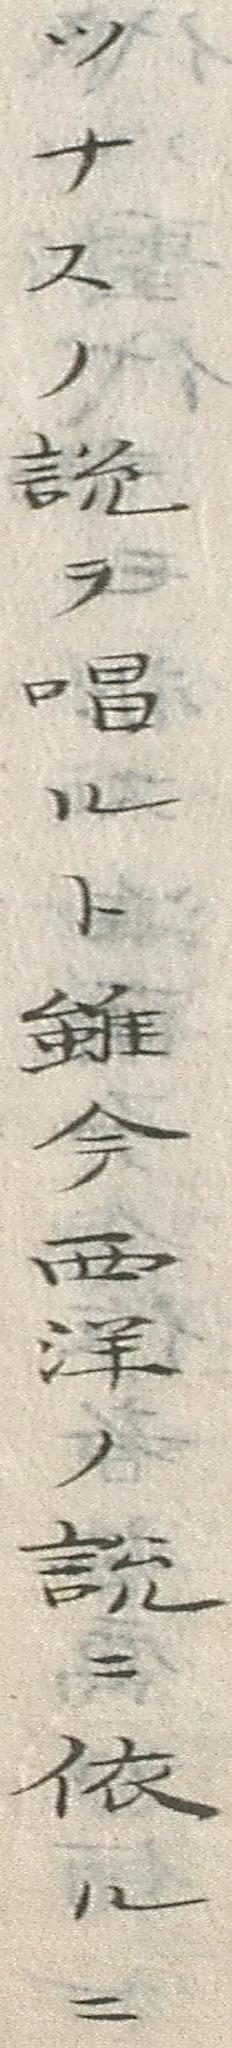ツナスノ説ヲ唱ルト雖今西洋ノ説ニ依ルニ
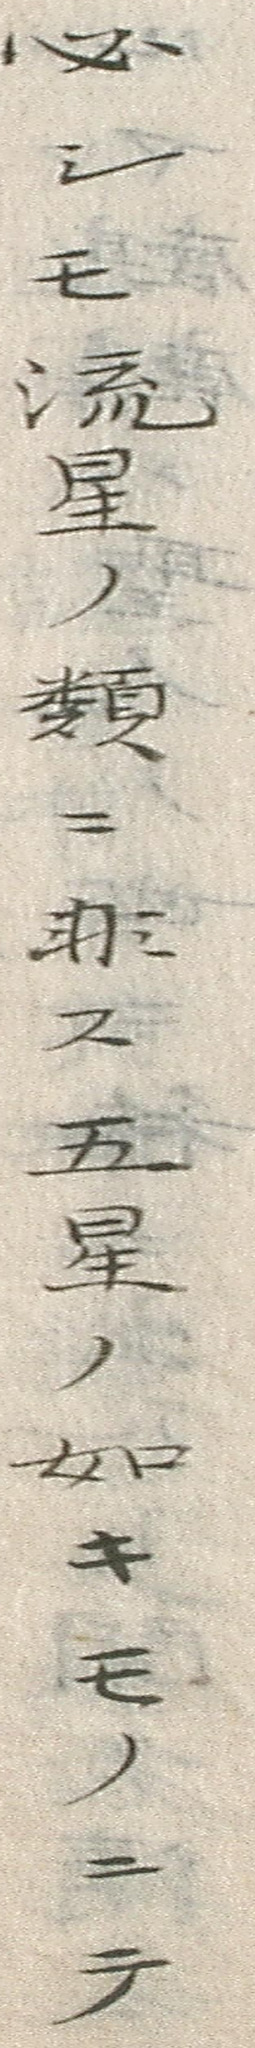必シモ流星ノ類ニ非ス五星ノ如キモノニテ
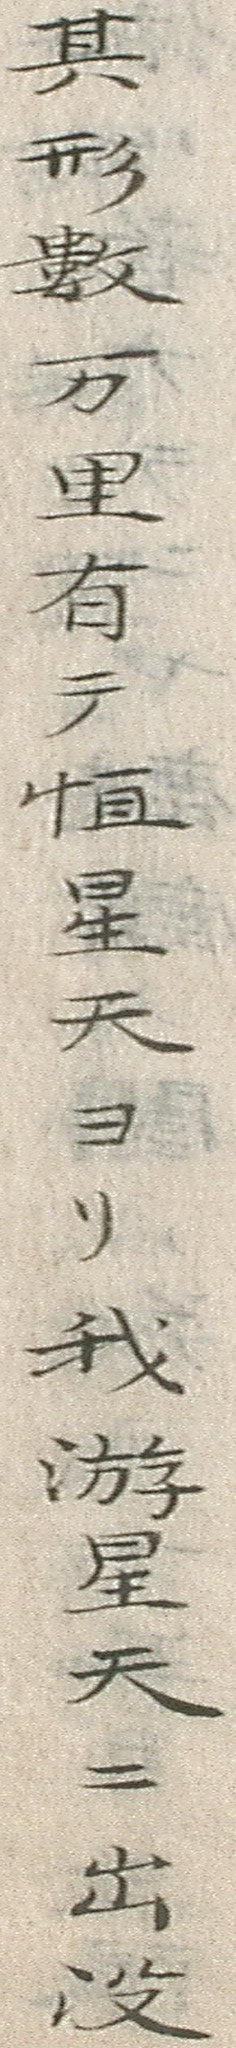其形数万里有テ恒星天ヨリ我游星天ニ出没
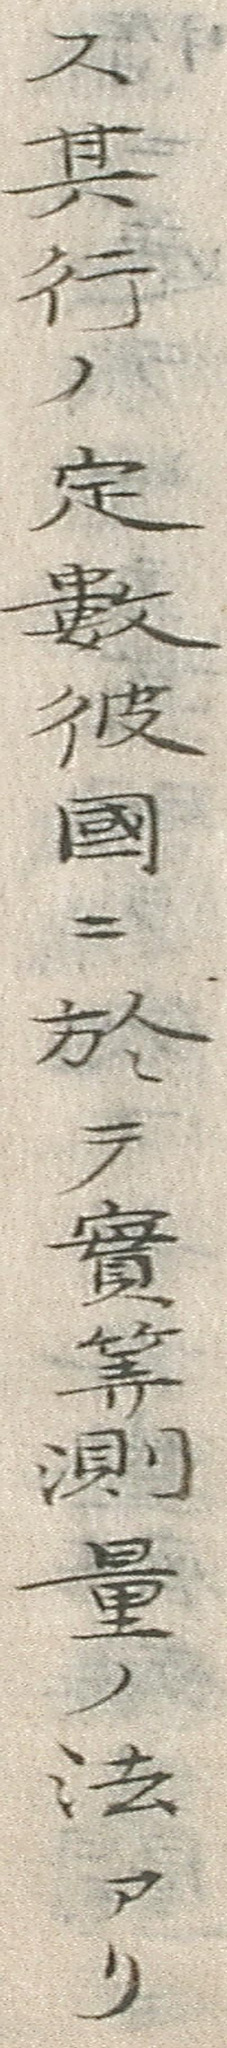ス其行ノ定数彼国ニ於テ実算測量ノ法アリ
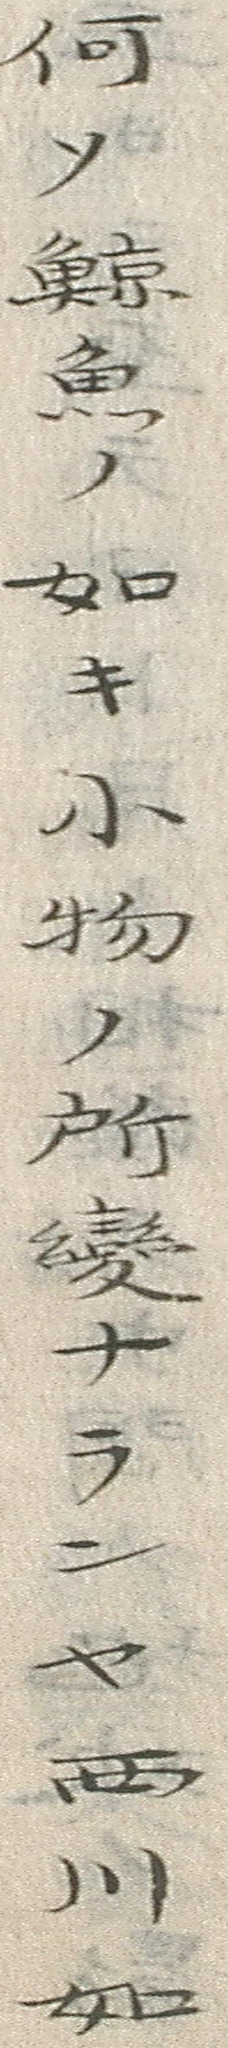何ソ鯨魚ノ如キ小物ノ所変ナランヤ西川如
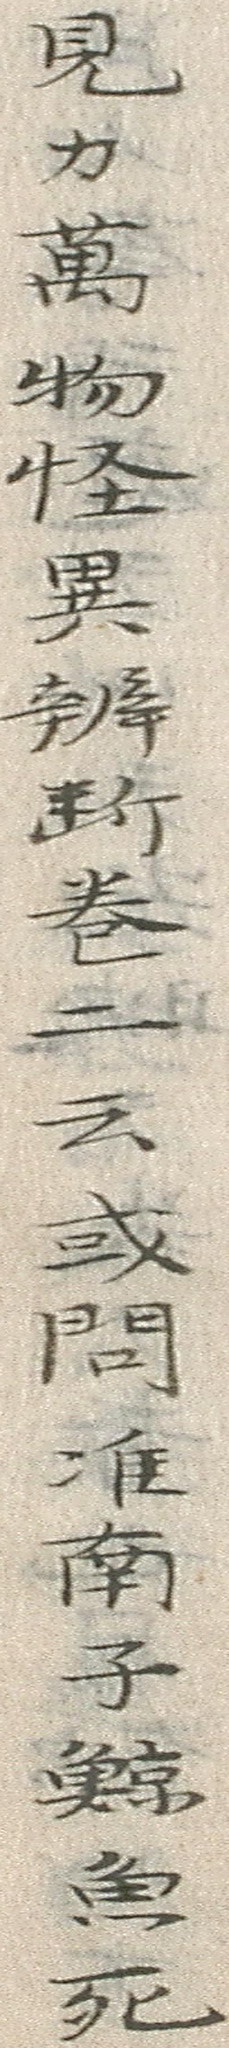見カ万物怪異弁断巻ニ云或問淮南子鯨魚死
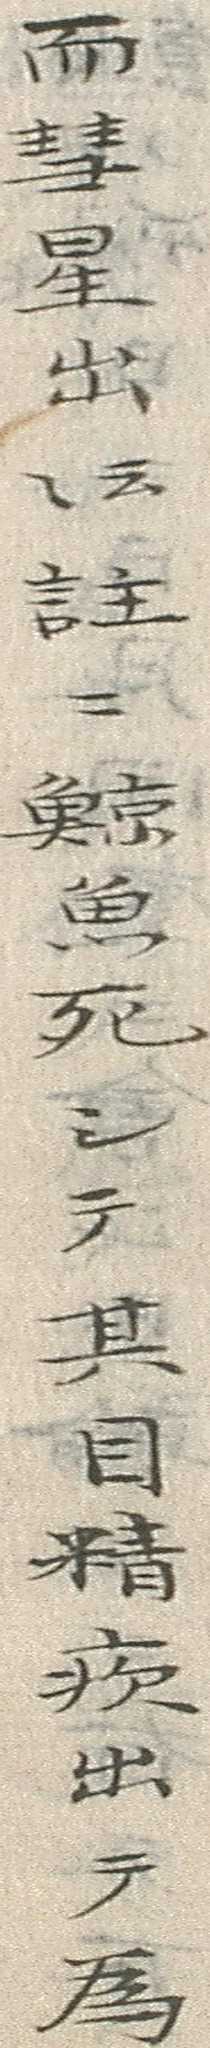而彗星出云〻註ニ鯨魚死シテ其目精𤴼出テ為
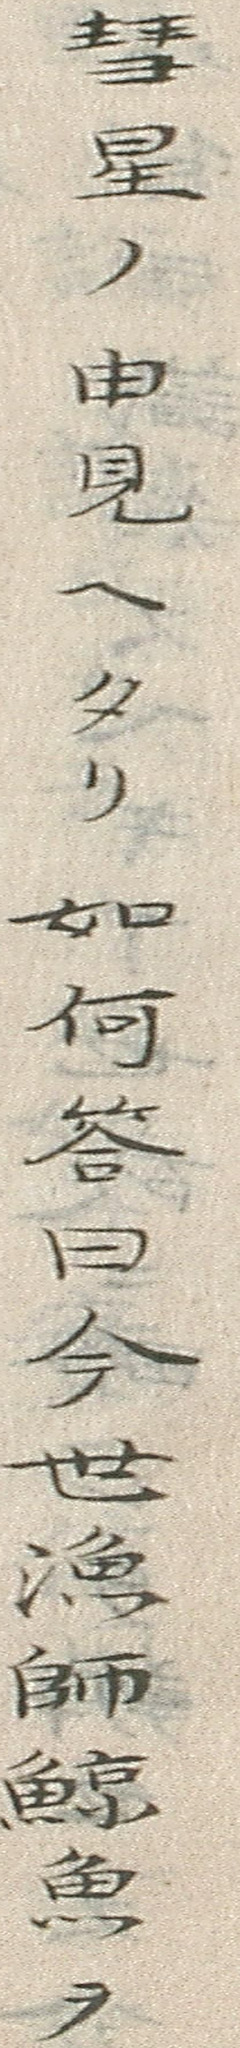彗星ノ由見ヘタリ如何答曰今世漁師鯨魚ヲ
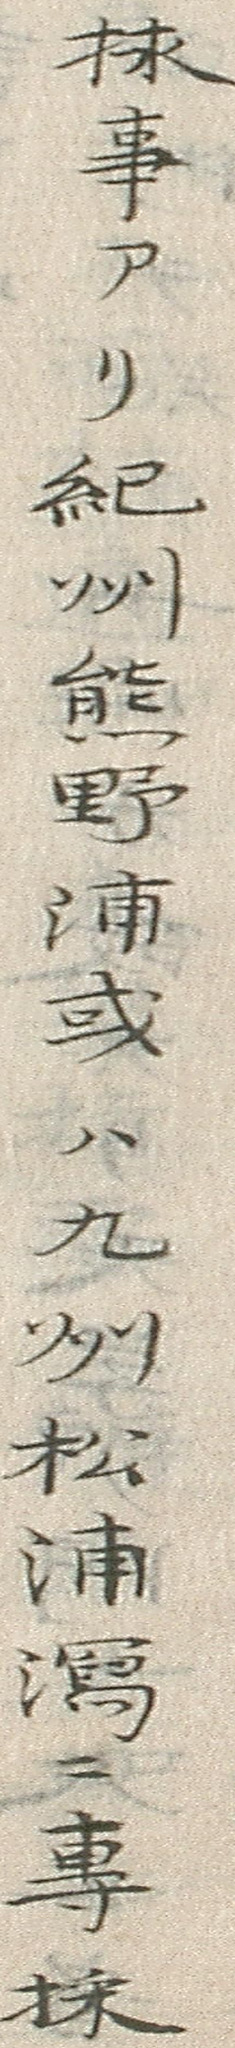捄事アリ紀州熊野浦或ハ九州松浦潟ニ専採
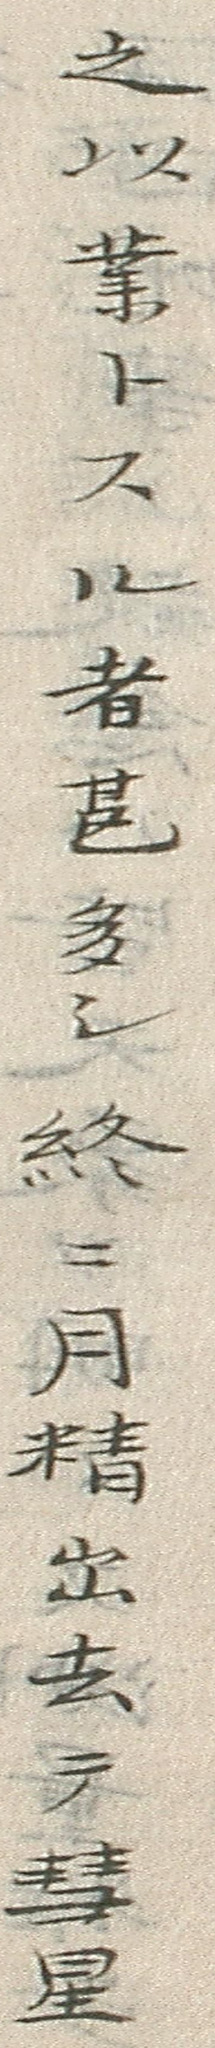之以業トスル者甚多シ終ニ月精出去テ彗星
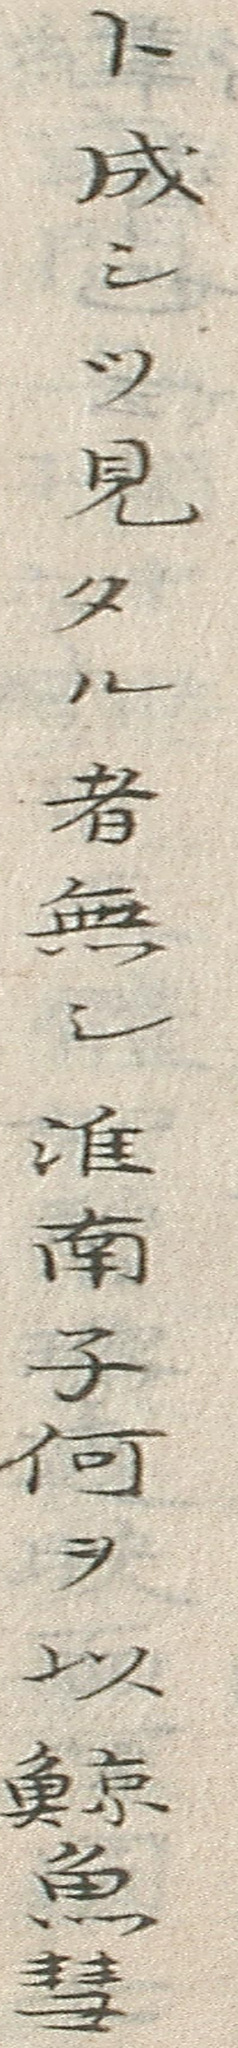ト成シツ見タル者無シ淮南子何ヲ以鯨魚彗
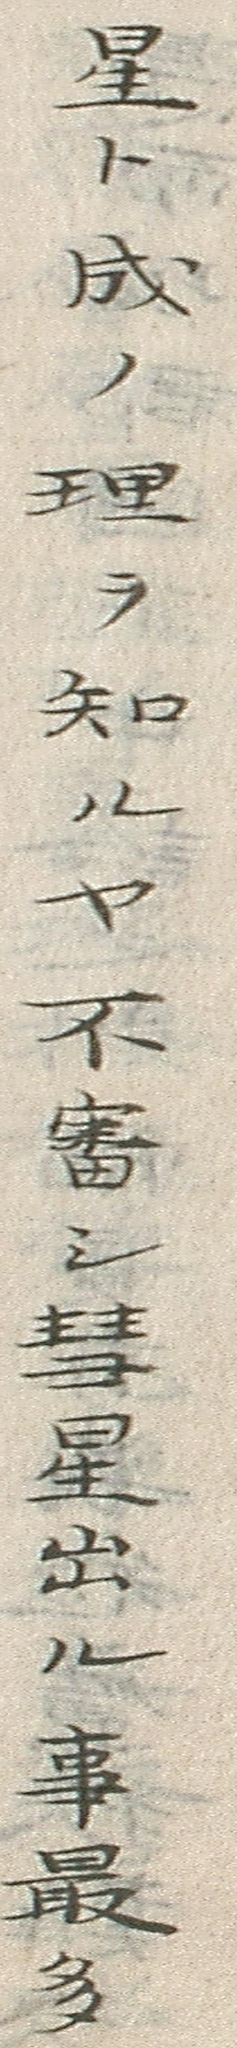星ト成ノ理ヲ知ルヤ不審シ彗星出ル事最多
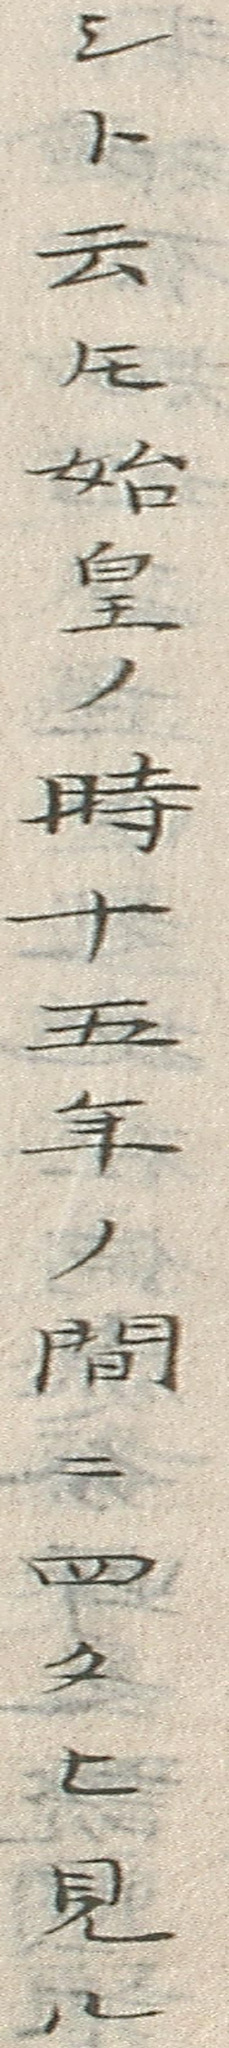シト云トモ始皇ノ時十五年ノ間ニ四タヒ見ル
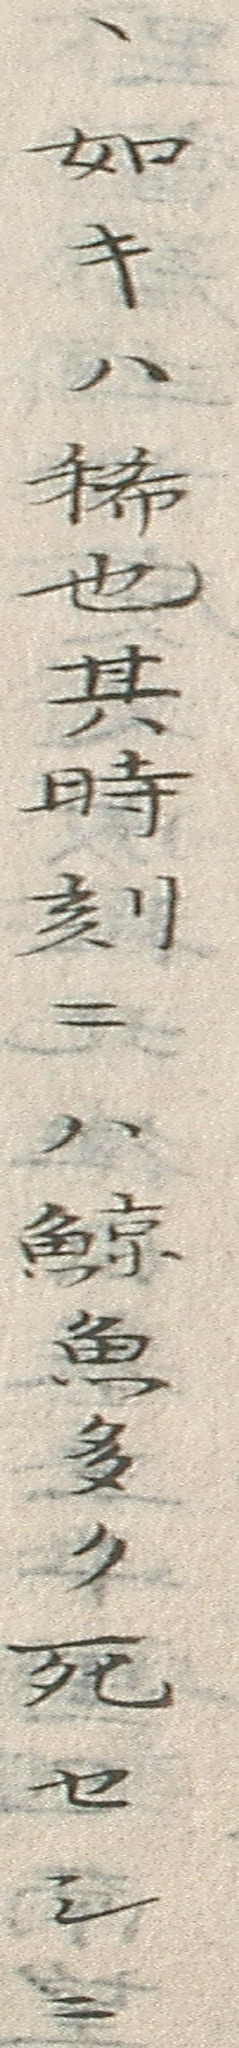ヽ如キハ稀也其時刻ニハ鯨魚多ク死セシニ
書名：天學略名目羽翼　全
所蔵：東京大学地震研究所図書室 Earthquake Research Institute Library, The University of Tokyo, JAPAN
